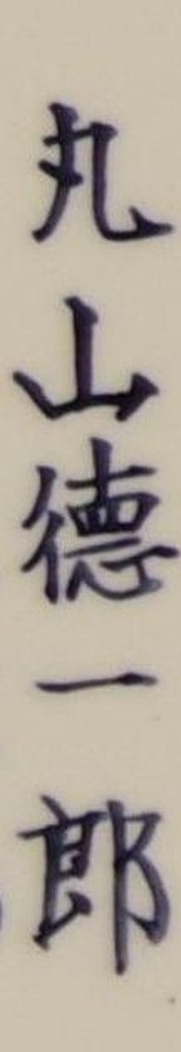丸山徳一郎
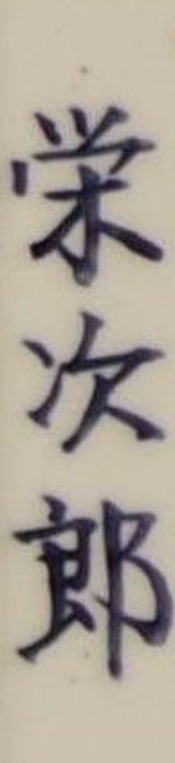栄次郎

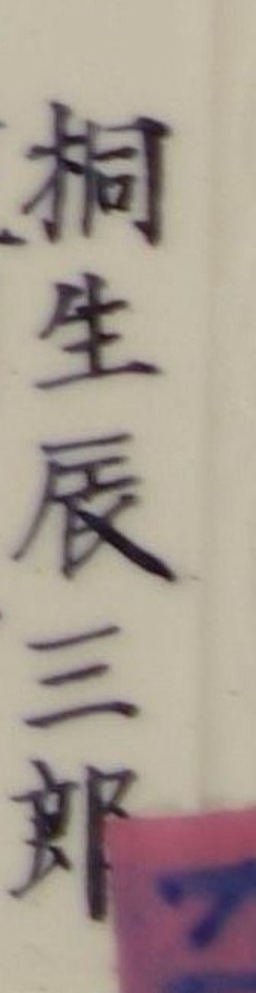桐生辰三郎
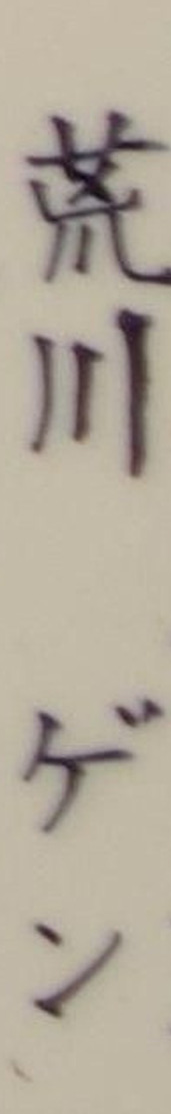荒川ゲン
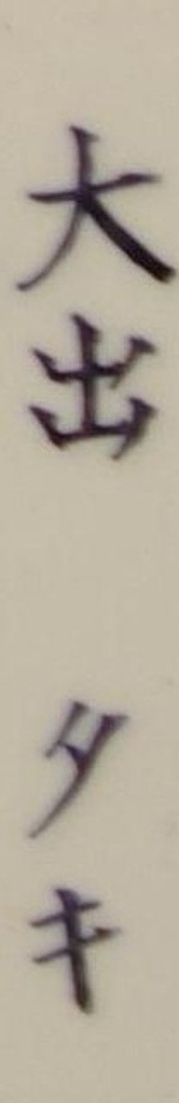大出タキ
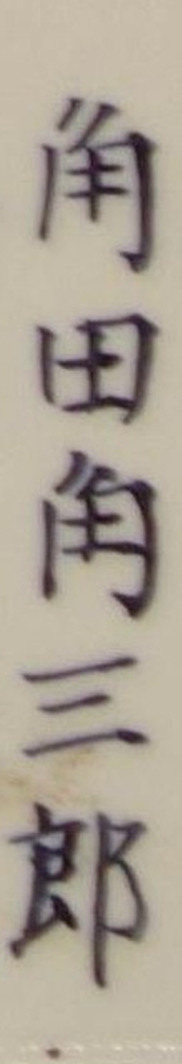角田角三郎
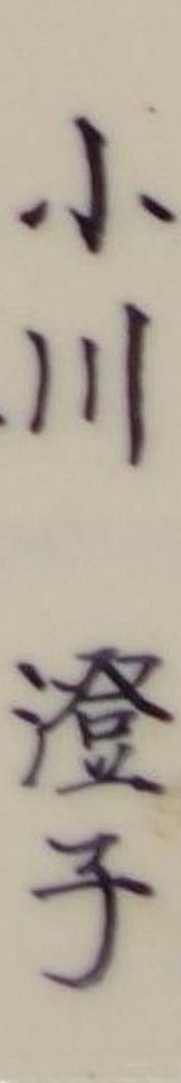小川澄子
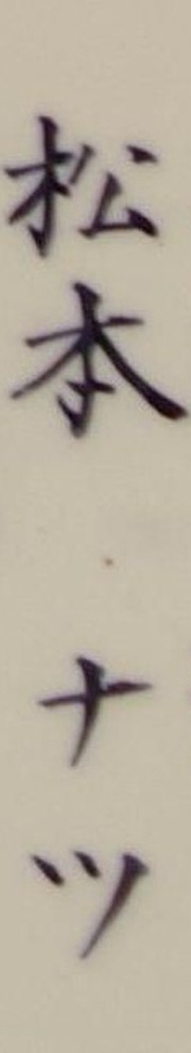松本ナツ
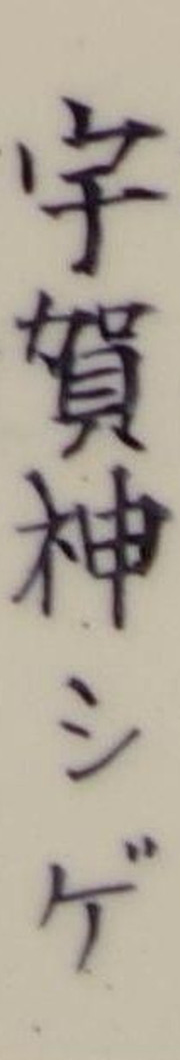宇賀神シゲ
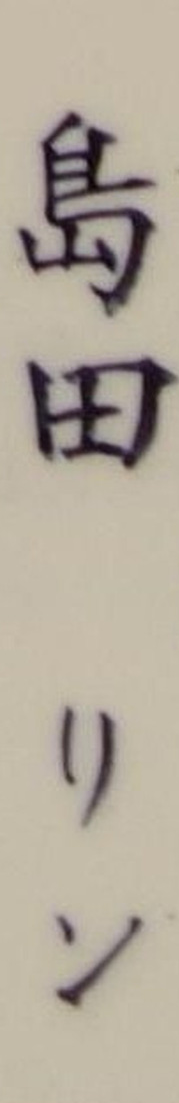島田リン
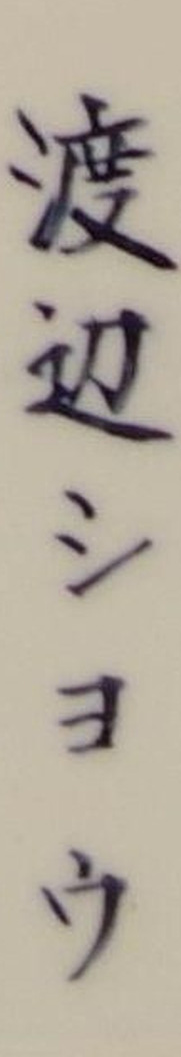渡辺シヨウ
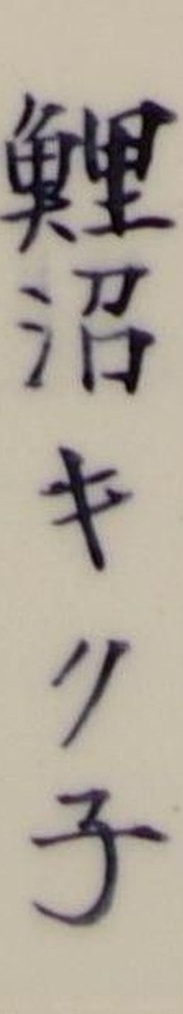鯉沼キク子
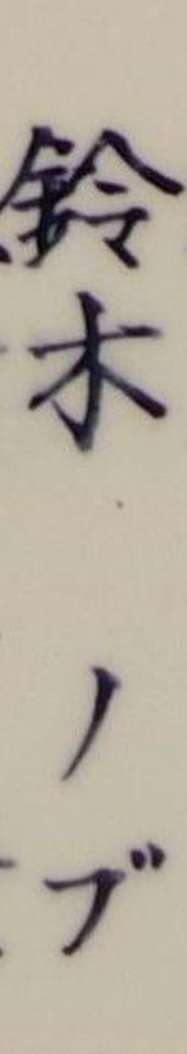鈴木ノブ
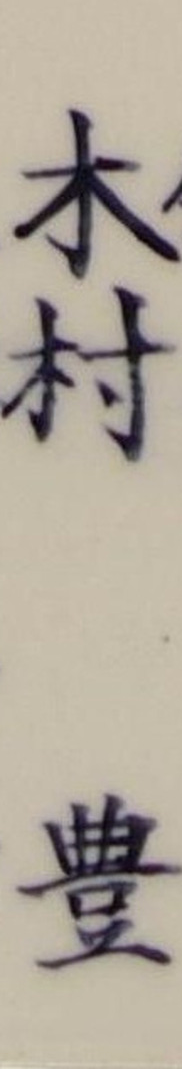木村豊
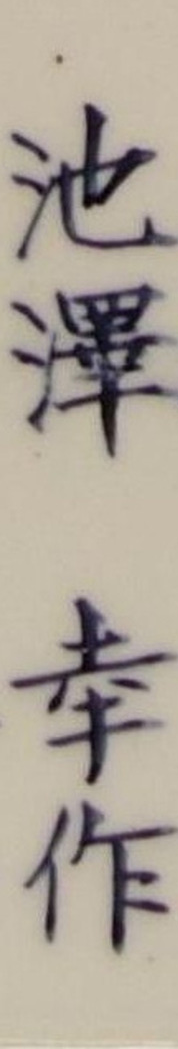池澤幸作
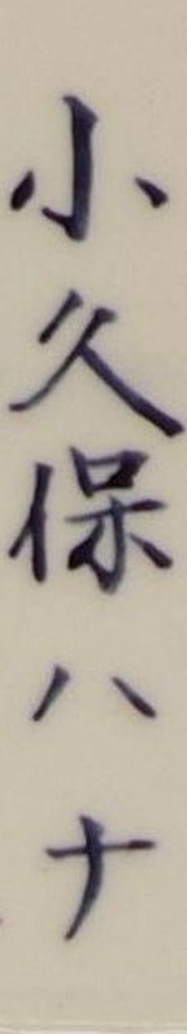小久保ハナ
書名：E~L
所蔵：高野山金剛峯寺
